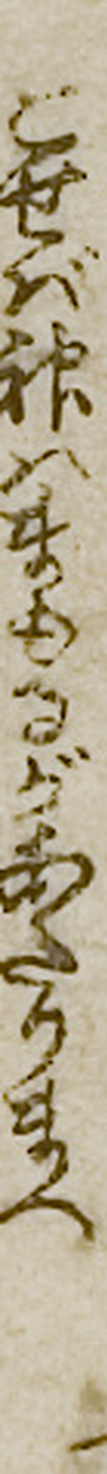こせば神はまもるがあたりまへ
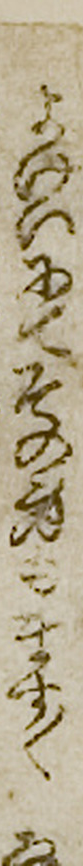よけいにてその身もます〳〵
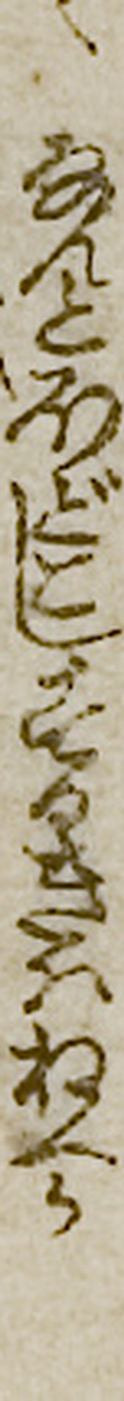なんとほどこしするきはねへか
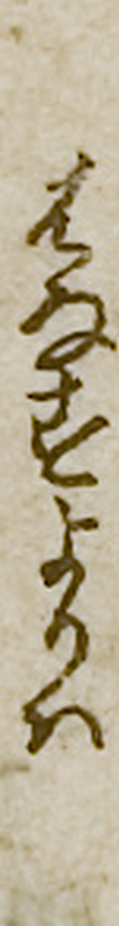はなすよりは
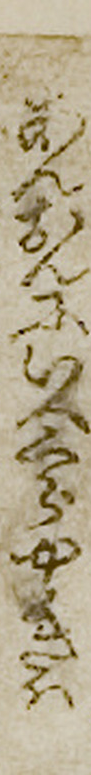あんおんにいへくらやしきは
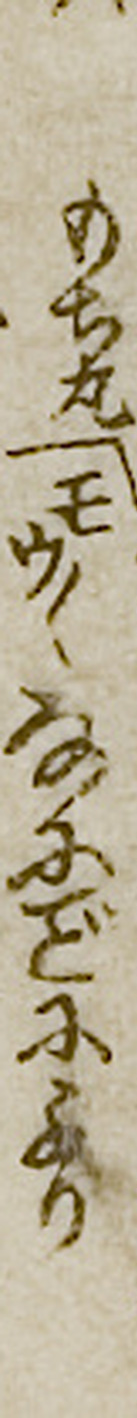もち丸「もう〳〵なにごとにより
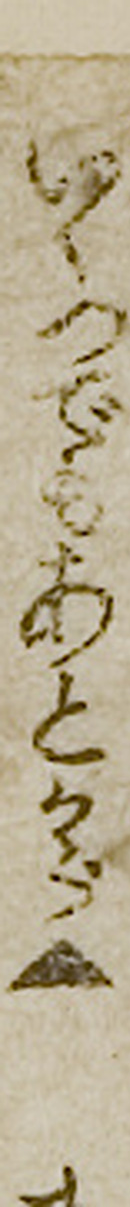いくつでもあとから▲
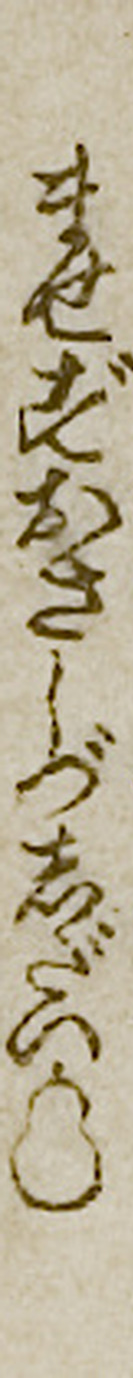ませずおさしづしだい記号
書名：[福助・恵比寿・大黒・閻魔の子 福神長者を諭す]
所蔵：東京大学総合図書館 General Library in the University of Tokyo, JAPAN
